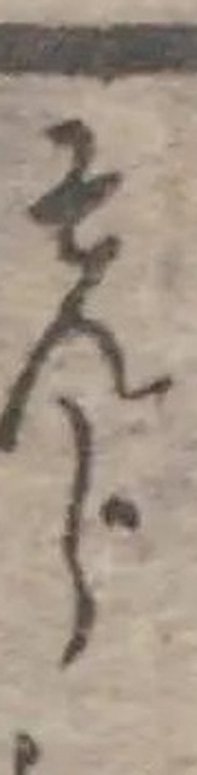そんじ
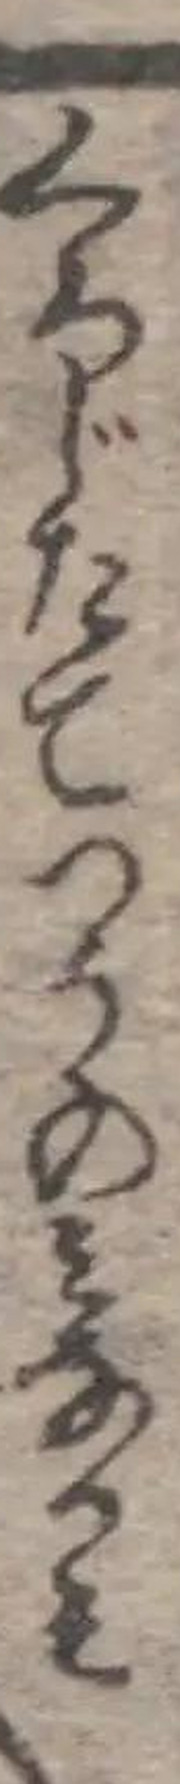くろじたてつうのみなかみ
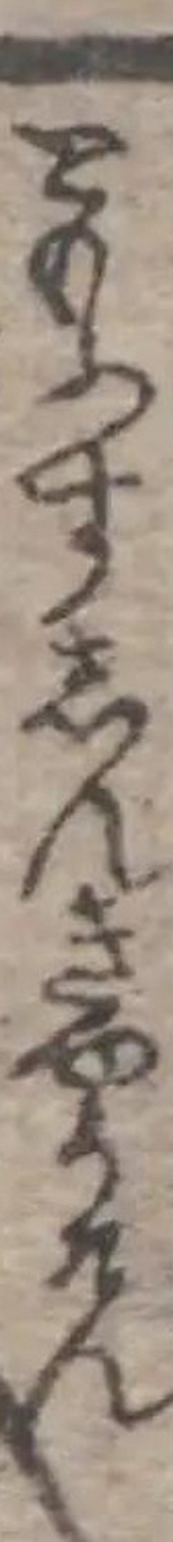ともうすしんきやうけん
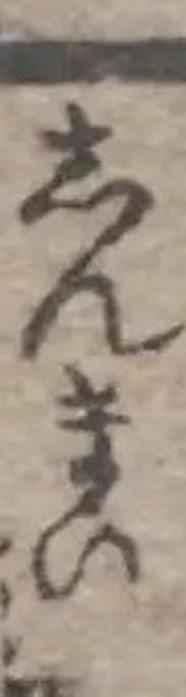しんまい
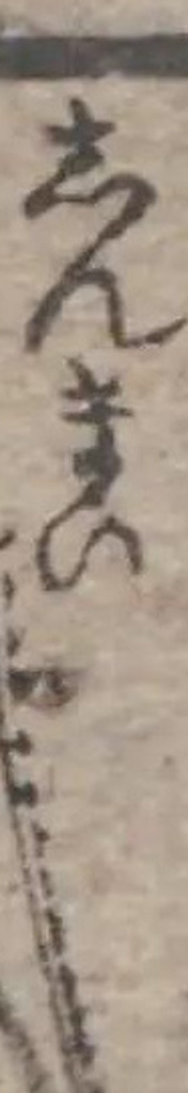しんまい
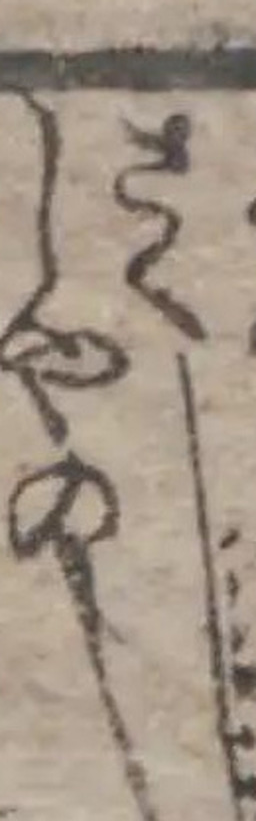しやの
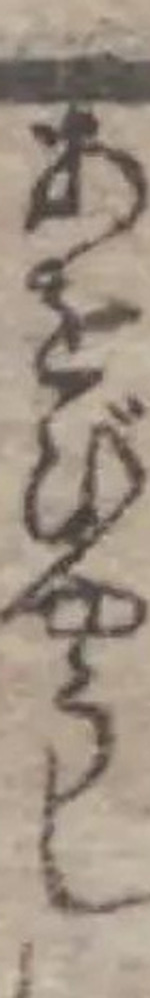あをびやうし
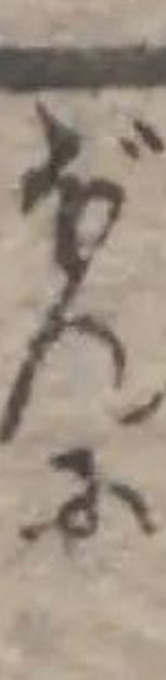ぼんに
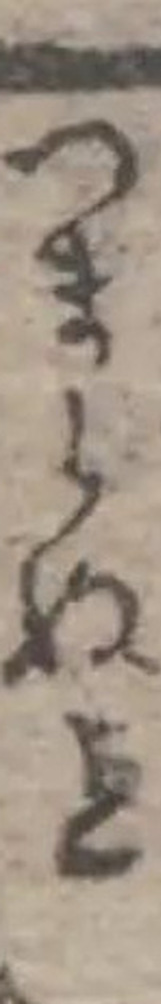つまらぬこと
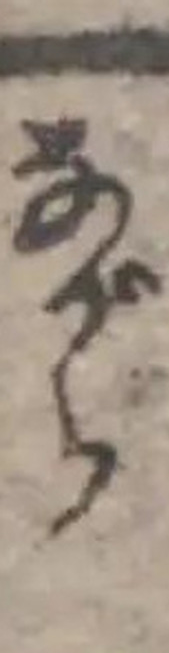ながら
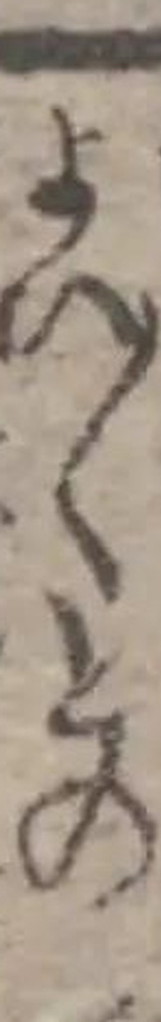よい〳〵との
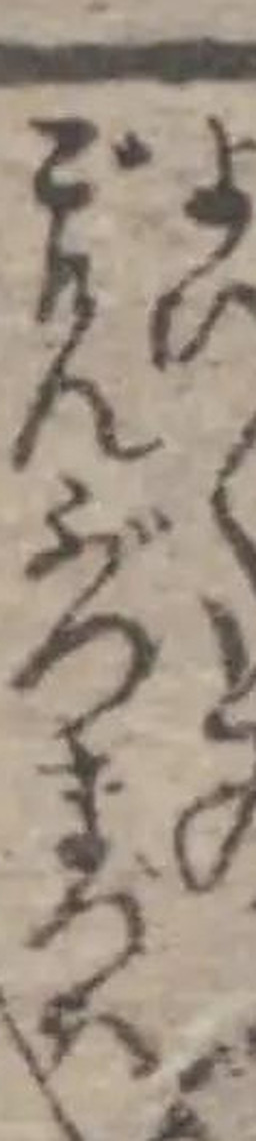ごけんぶつまづは
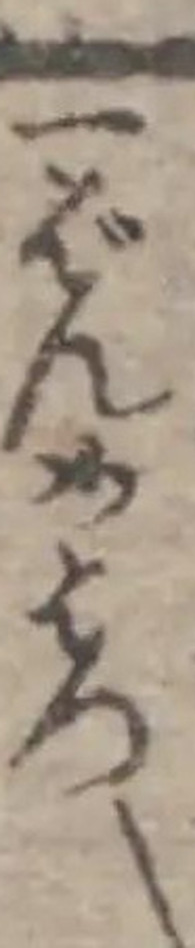一ばんめはつ
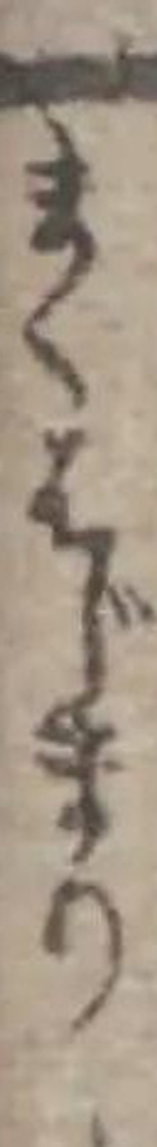まくはじまり
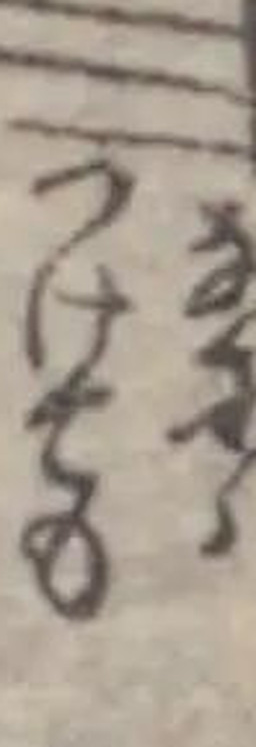つけても
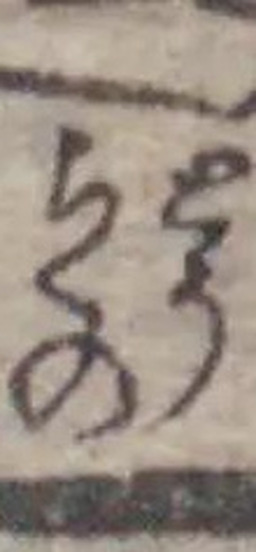らくの
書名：富多高慢噺 3巻
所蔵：国立国会図書館 National Diet Library, JAPAN
